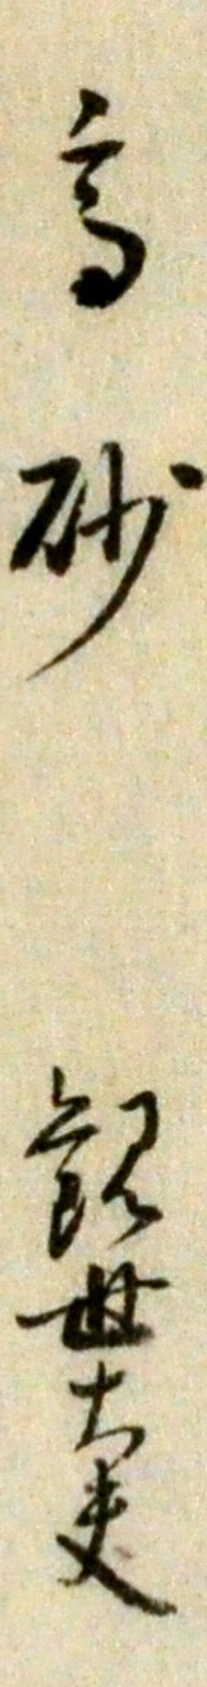高砂観世大夫
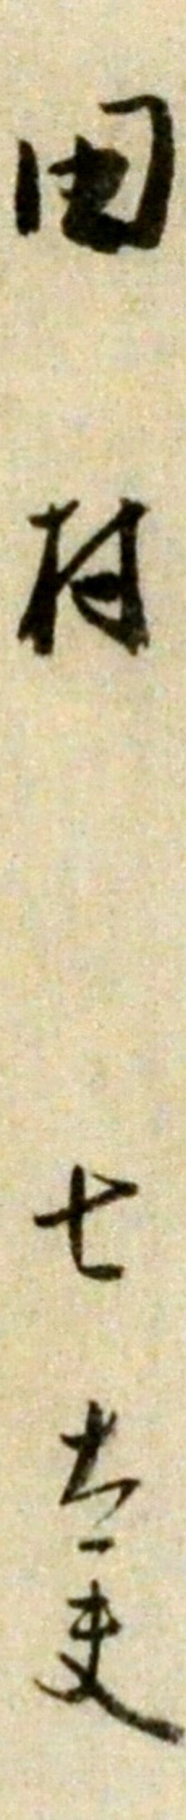田村七太夫
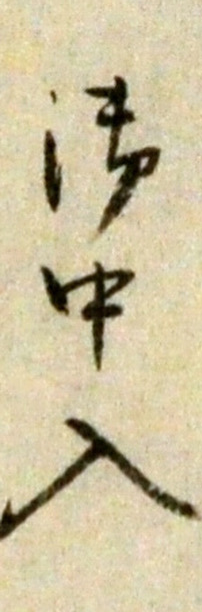御中入
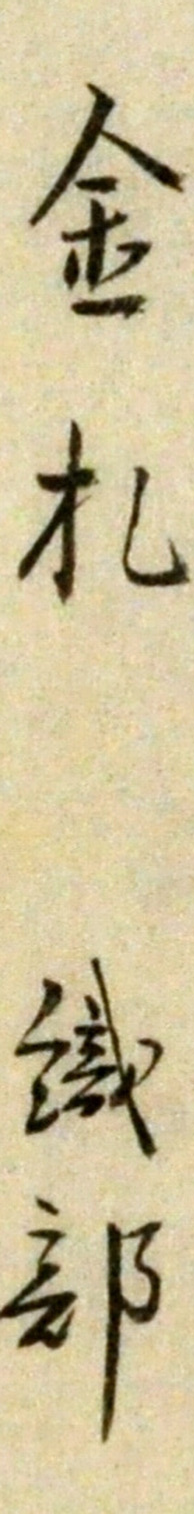金札織部
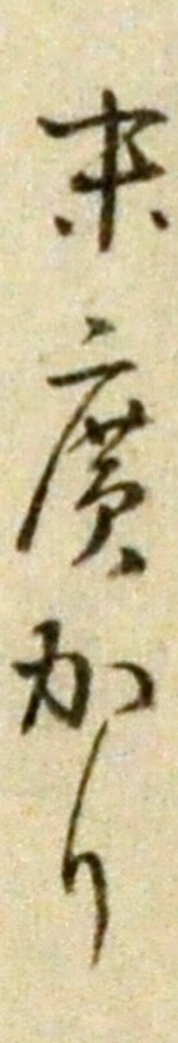末廣かり

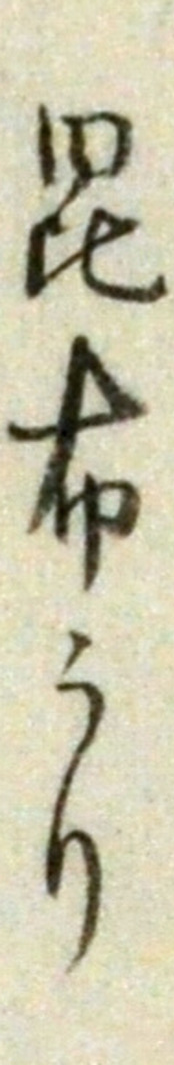昆布うり
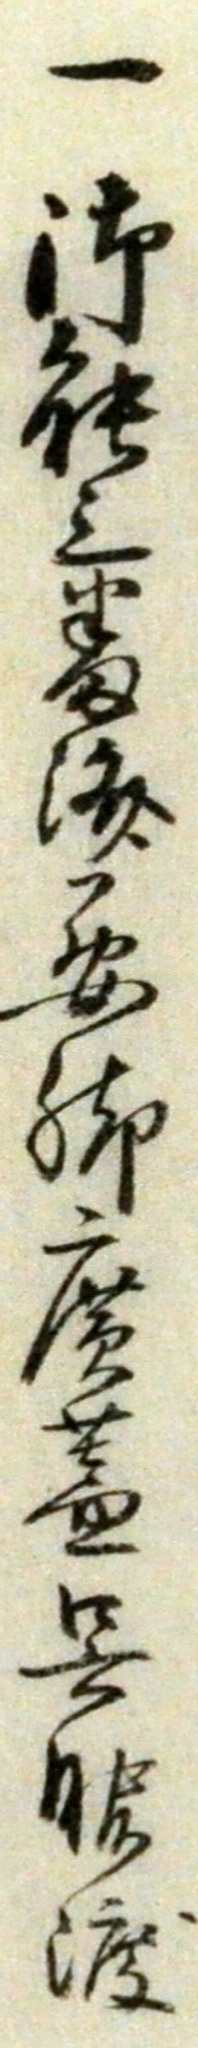一御能三番済要脚廣蓋呉服渡
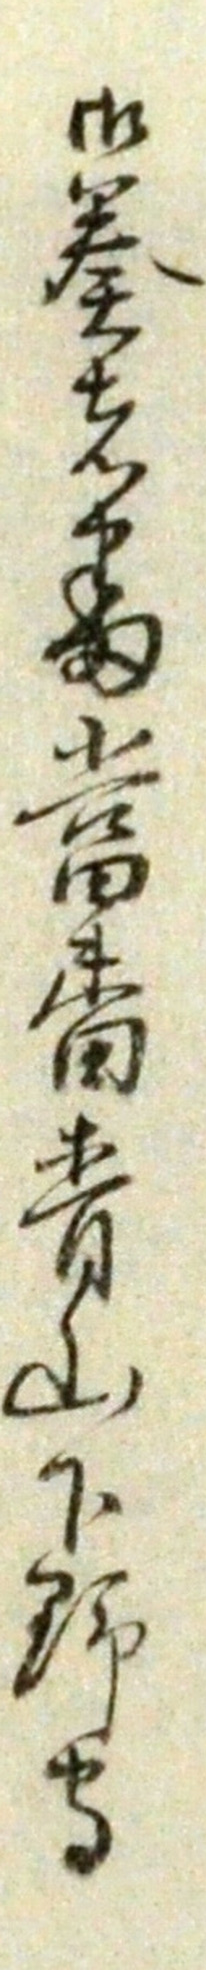御奏者番當番青山下野守
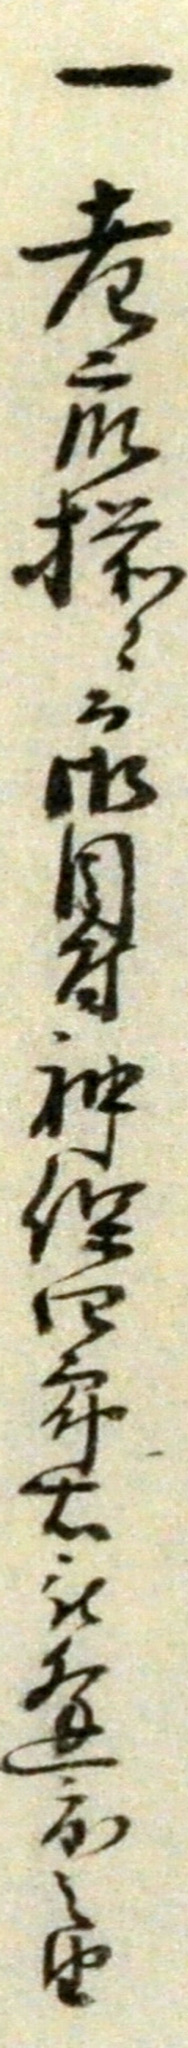一老衆揃ニ而御目付神保四郎右被逢度之由
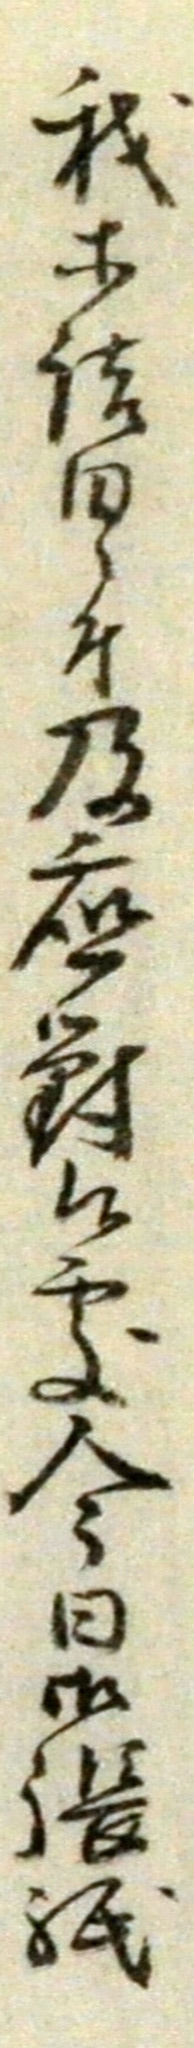我等詰日ニ付及應對候處今日御張紙
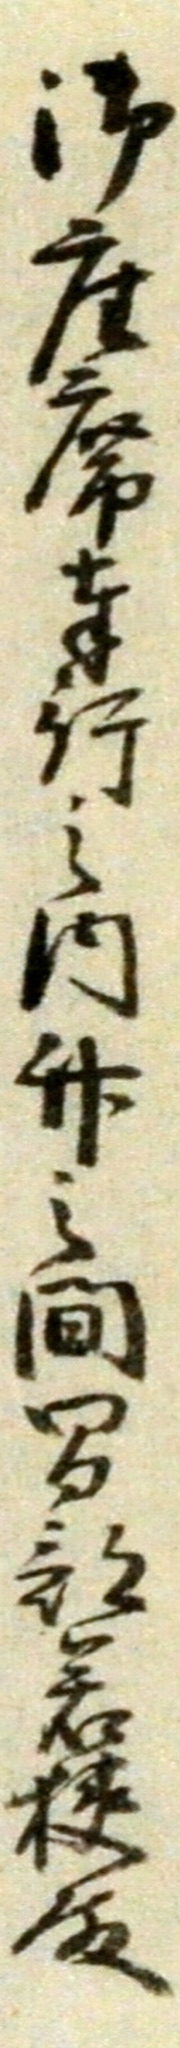御座席奉行之内竹之間間部若狭殿
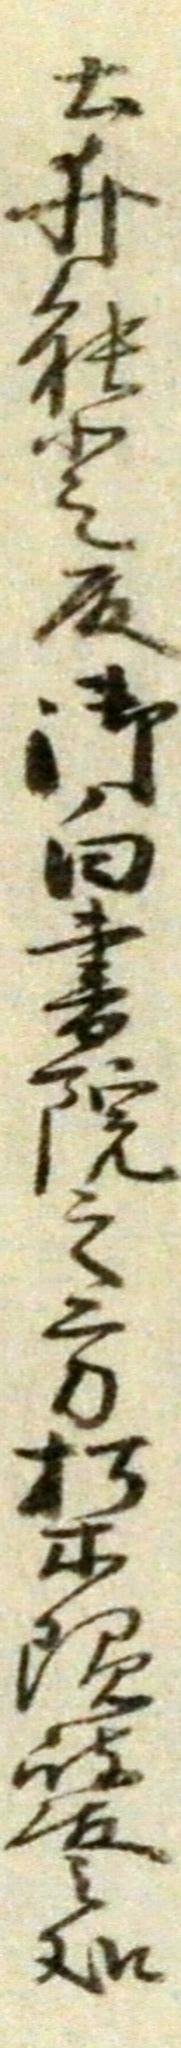土井能登殿御白書院之方朽木隠岐殿之処
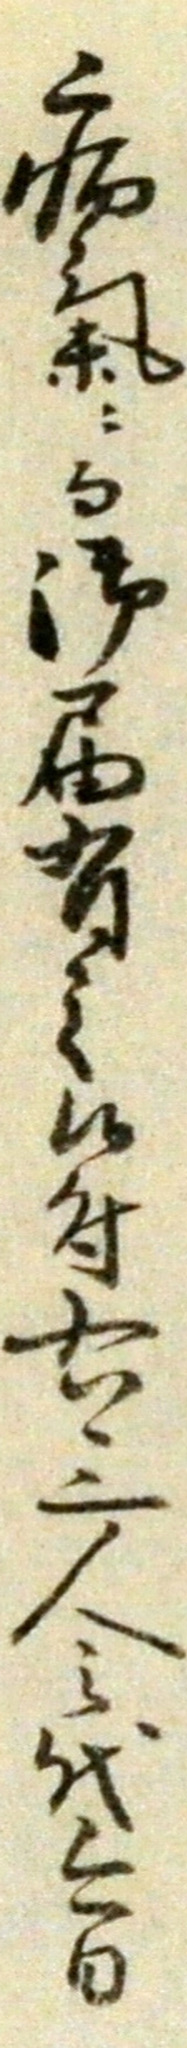病気ニ而御届有之候付右三人之代今日
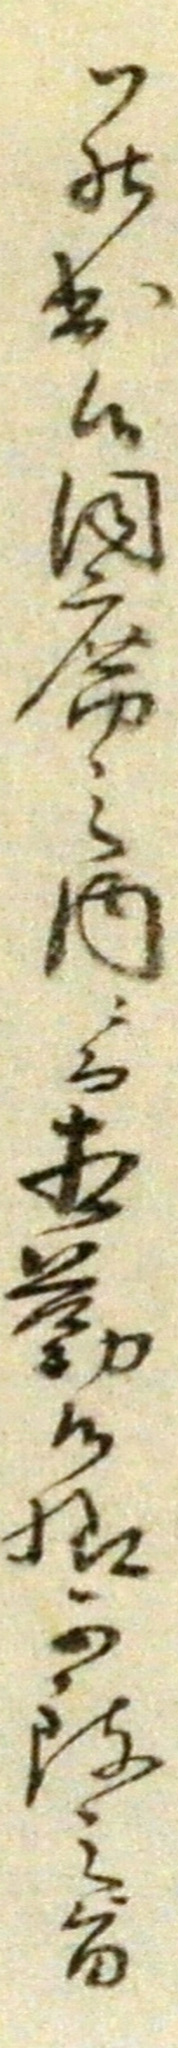罷出候同席之内ニ而相勤候様可致之旨
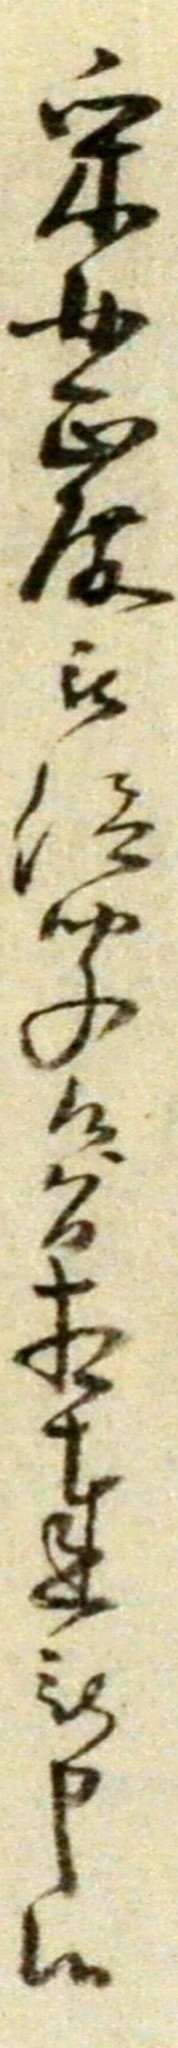采女正殿被仰聞候旨相達被申候
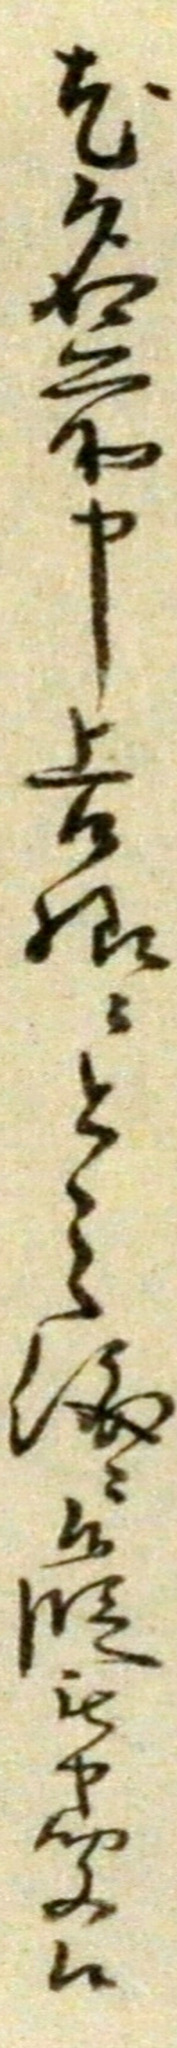尤名前申上候様ニと之儀ニ候段被申聞候
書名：若君様（家斉嫡男）誕生諸祝儀ノ節ノ留書外
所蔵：伊那市立高遠町図書館・合同会社AMANE
